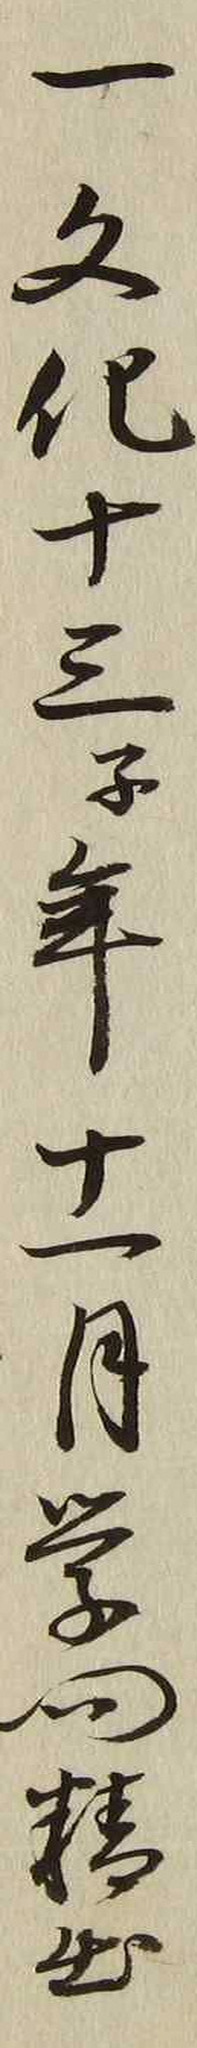一文化十三子年十一月学問精出
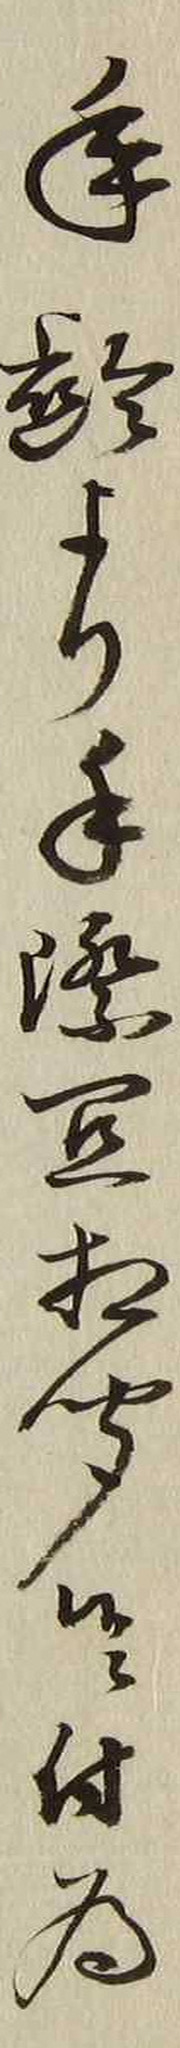年齢より手際宜相聞候ニ付為
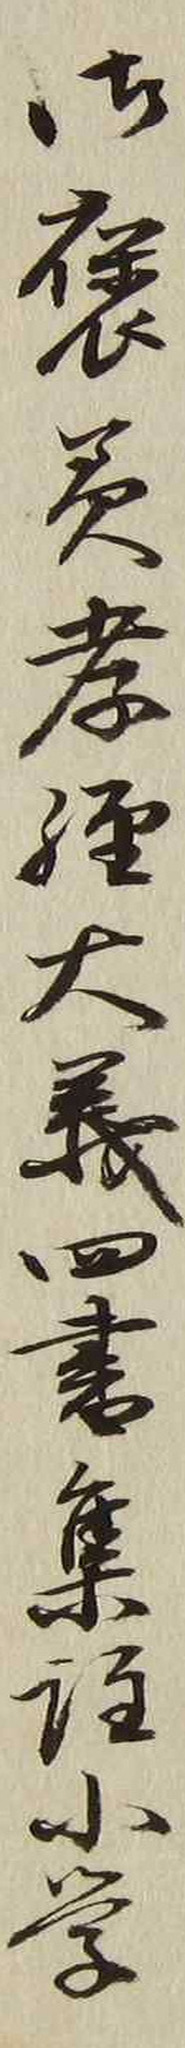御褒美孝経大儀四書集註小学
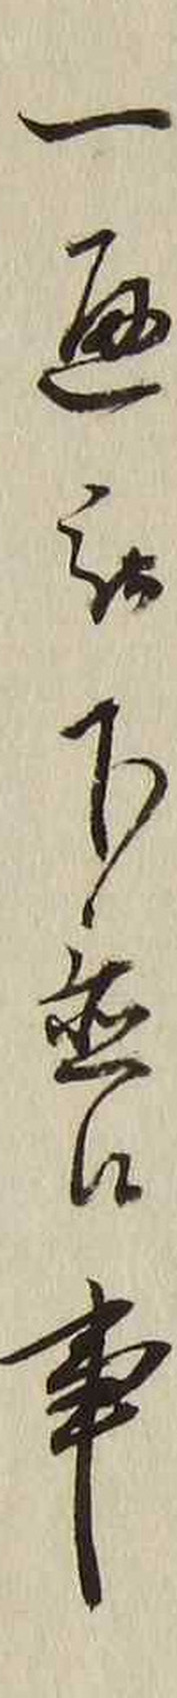一通被下置候事
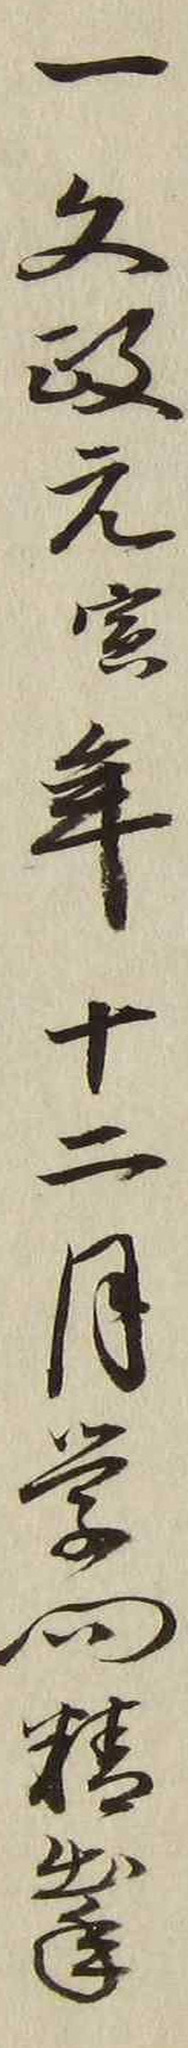一文政元寅年十二月学問精出年
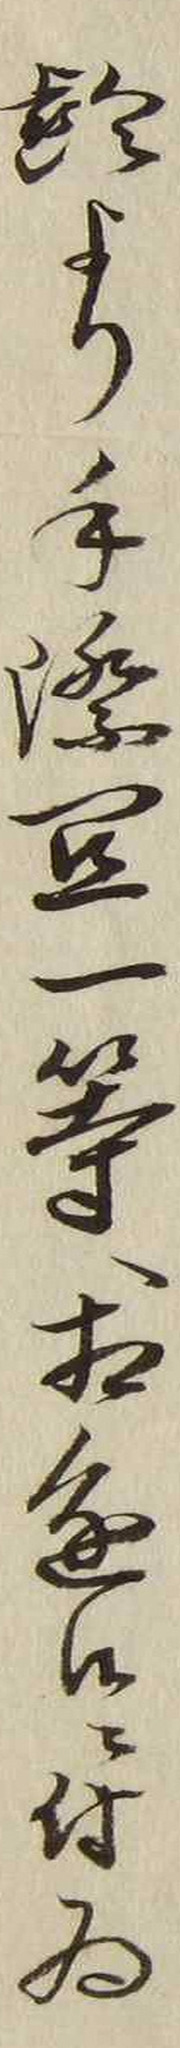齢より手際宜一等へ相進候ニ付為

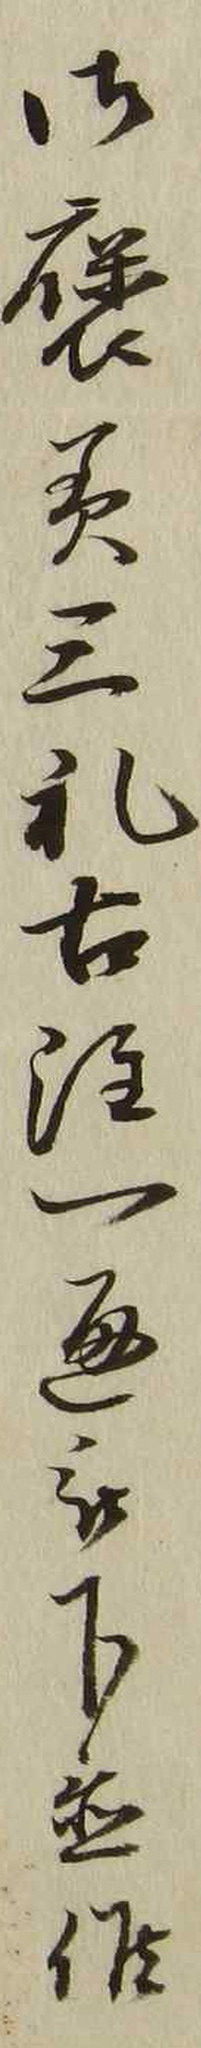御褒美三礼古注一通被下置候
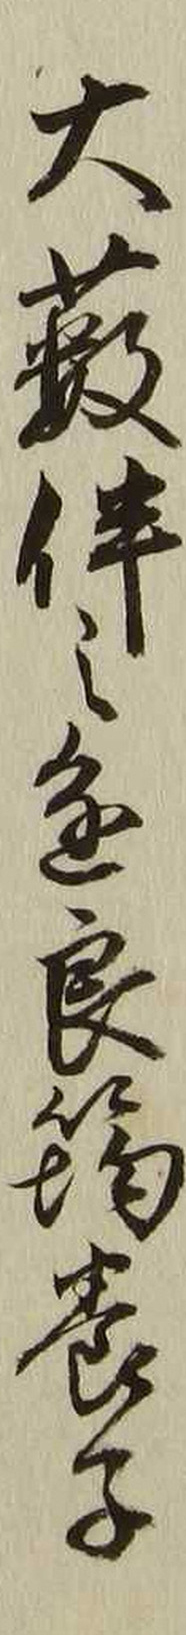大藪伴之進良筠養子
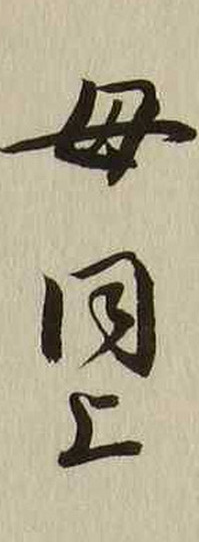母同上
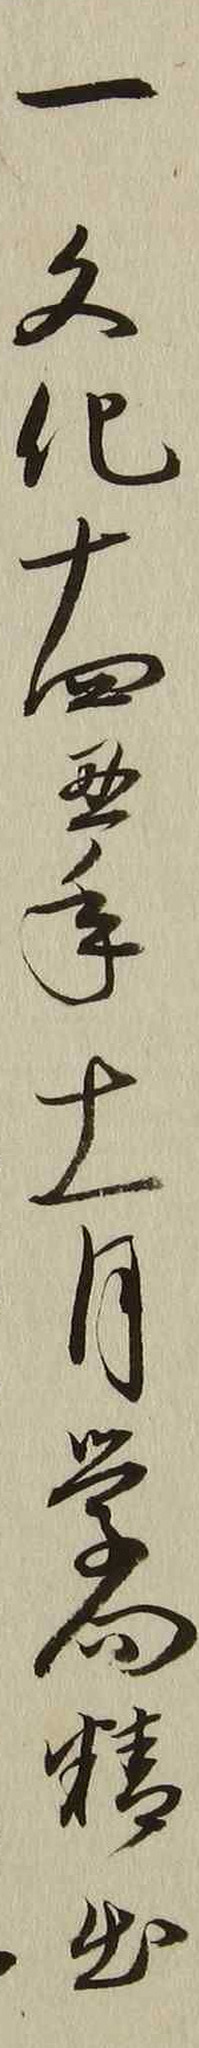一文化十四丑年十一月学問精出
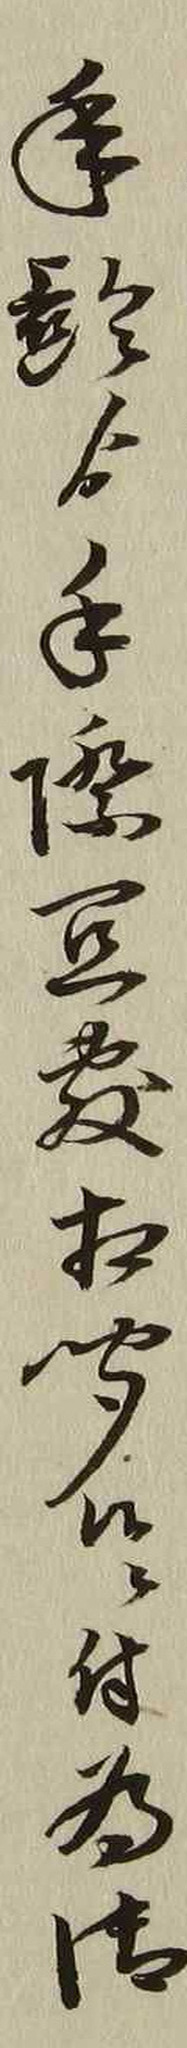年齢ゟ手際宜敷相聞候ニ付為御
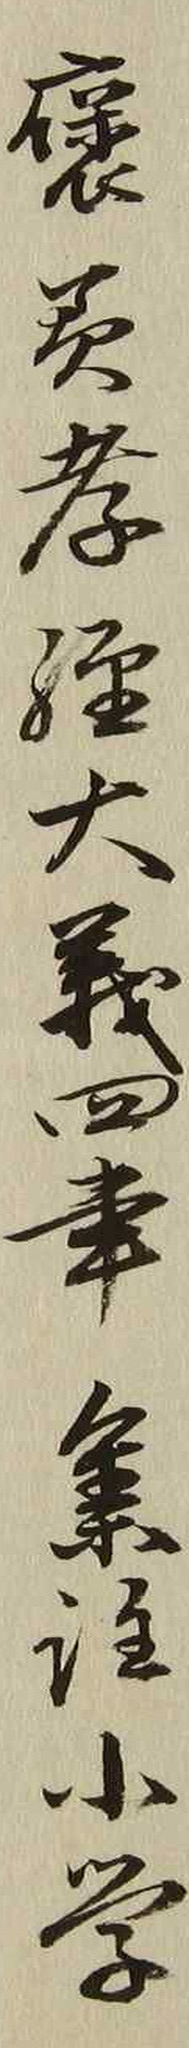褒美孝経大義四書集注小学
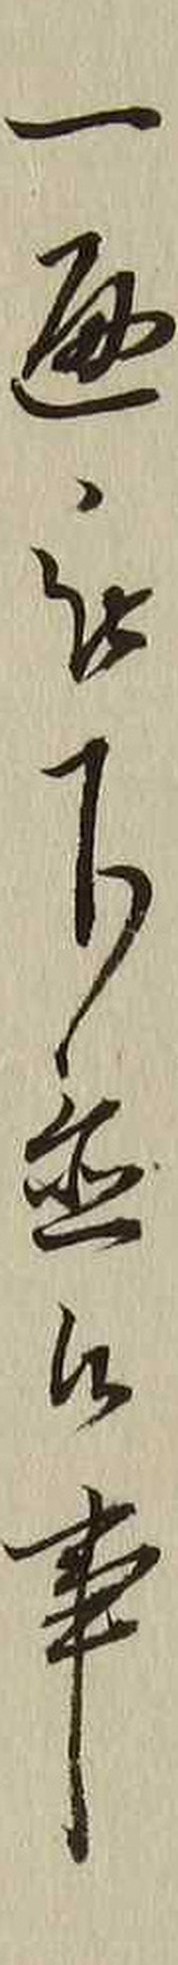一通被下置候事
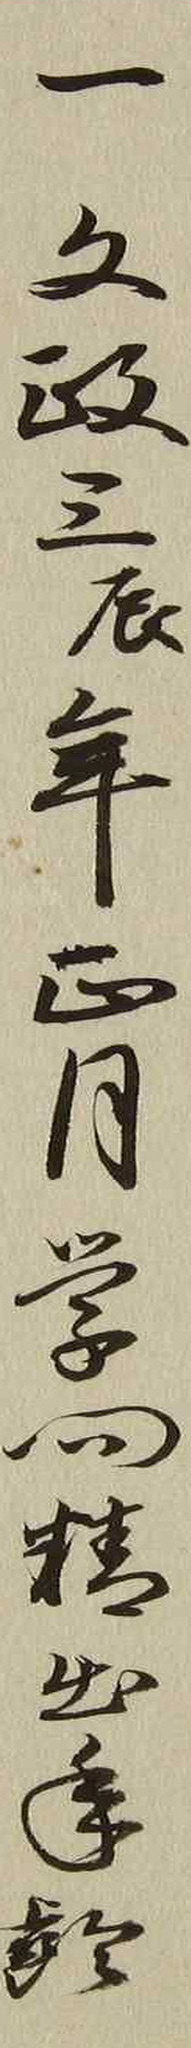一文政三辰年正月学問精出年齢
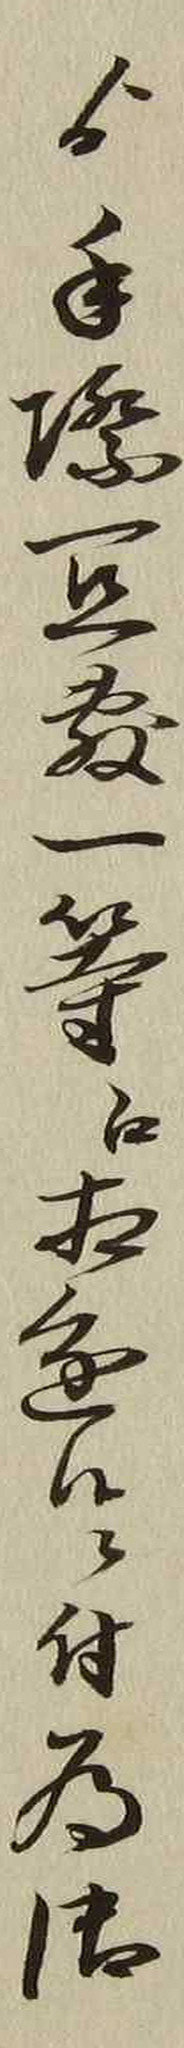ゟ手際宜敷一等江相進候ニ付為御
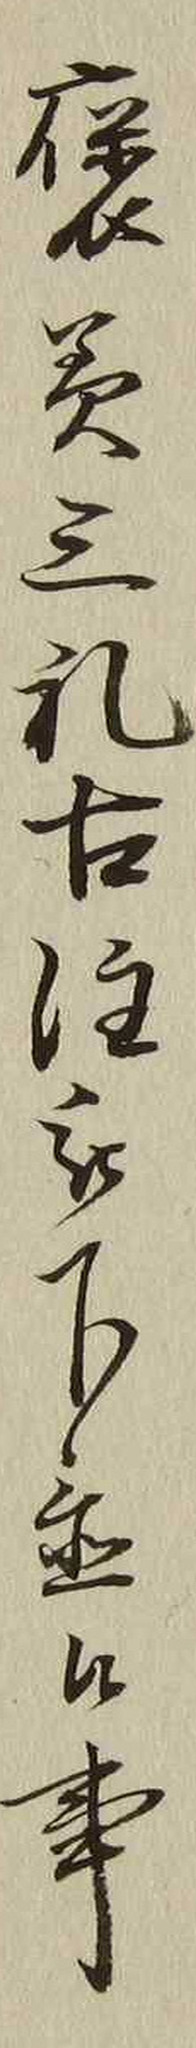褒美三礼古注下置候事
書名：諸士系譜　巻之61　と之部4
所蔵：会津若松市立会津図書館
